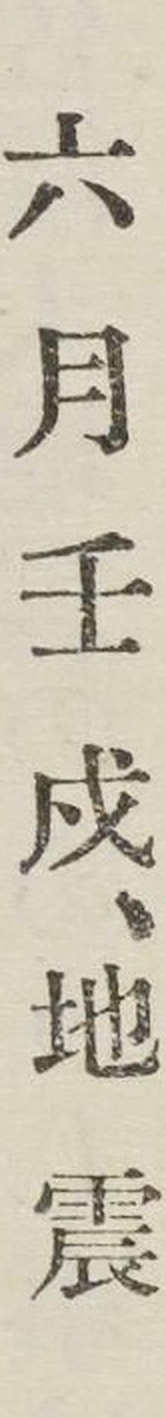同六月壬戌、地震
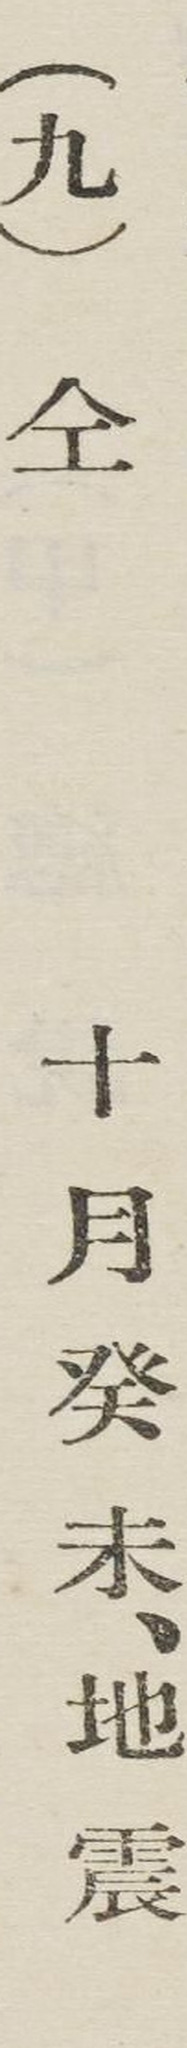同十月癸未、地震
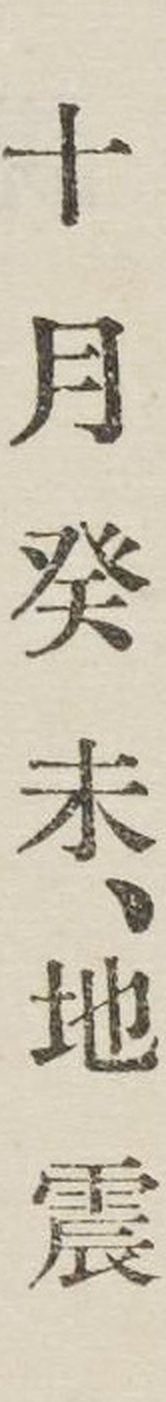同十月癸未、地震
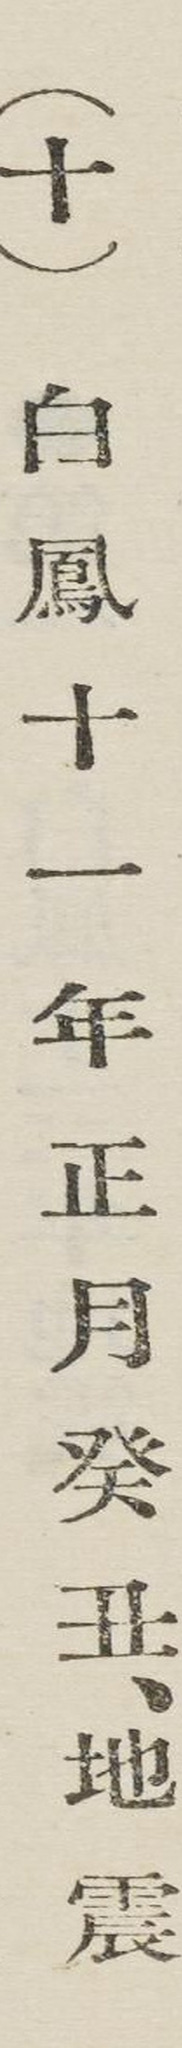白鳳十一年正月癸丑、地震
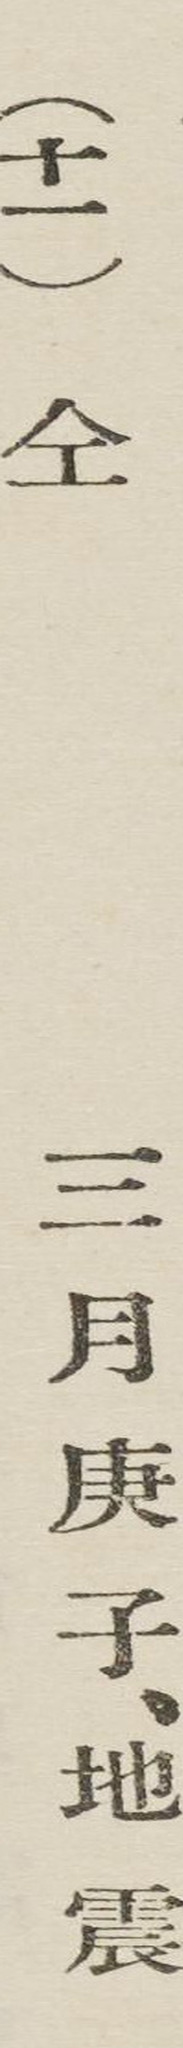同三月庚子、地震
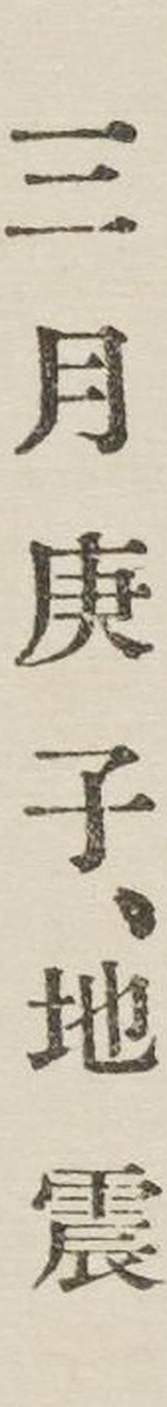同三月庚子、地震
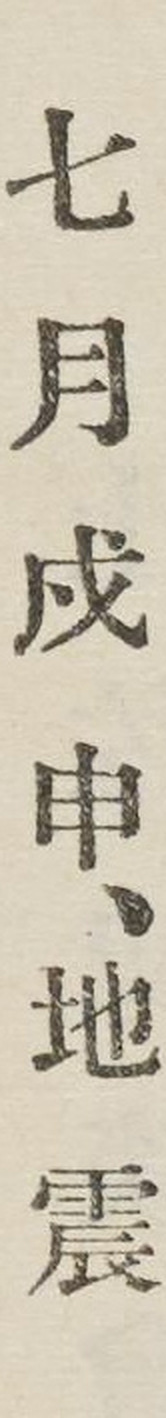同七月戌申、地震
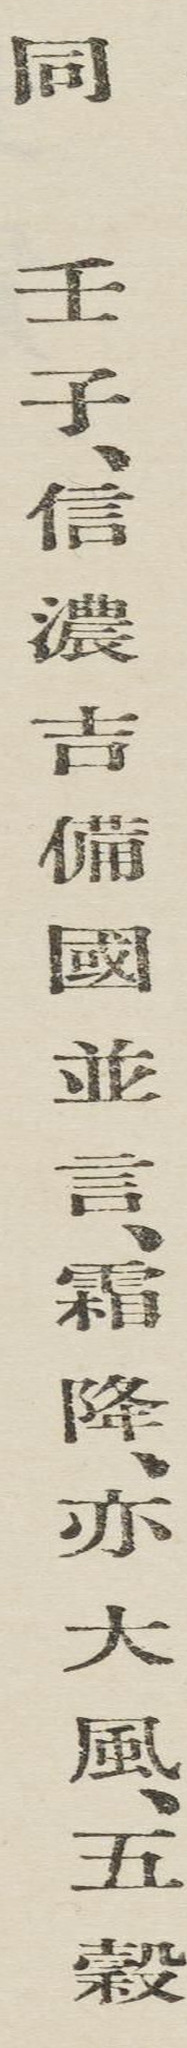同同壬子、信濃吉備国並言、霜降、亦大風、五穀
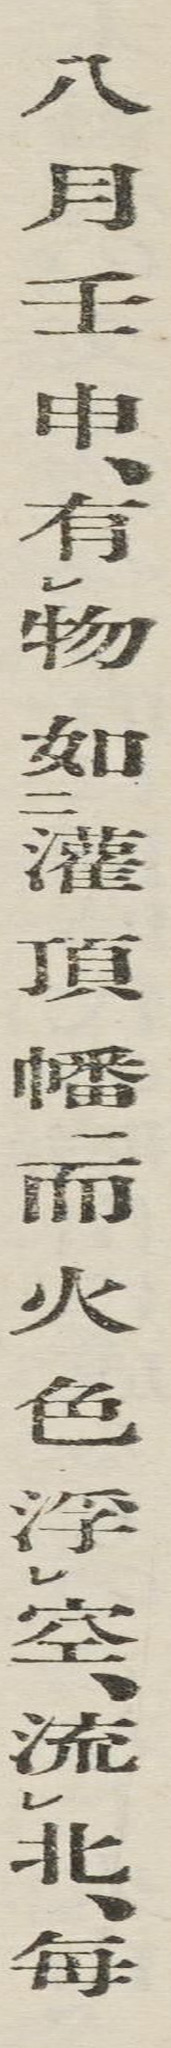同八月壬申、有物如灌頂幡而火色浮空、流北、毎
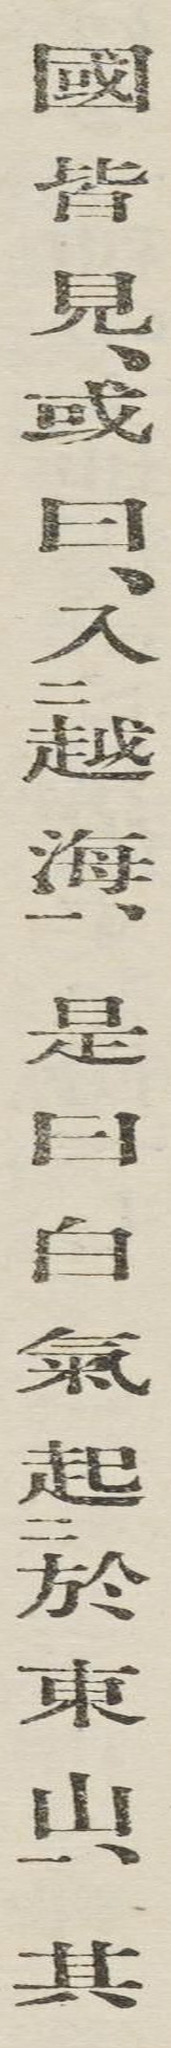国皆見、或曰、入越海、是曰白気起於東山、其
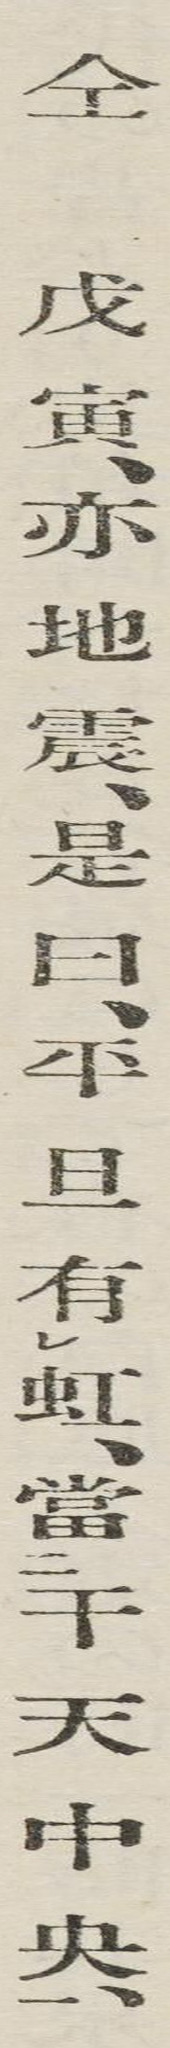同同戊寅、亦地震、是曰、平旦有虹、当于天中央、
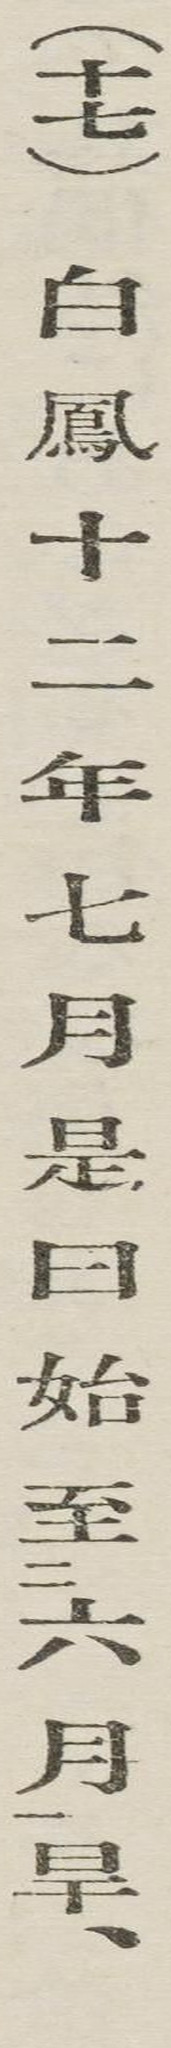白鳳十二年七月是曰始至六月旱、
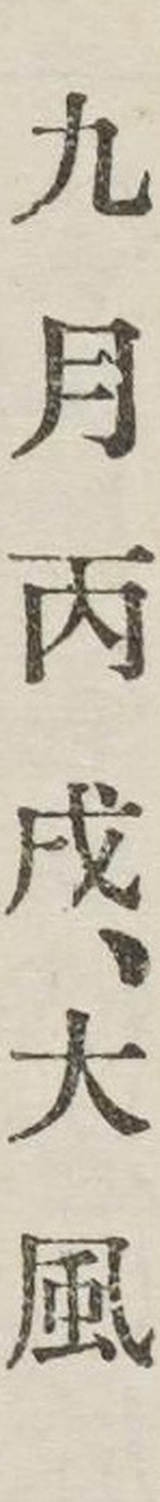同九月丙戌、大風
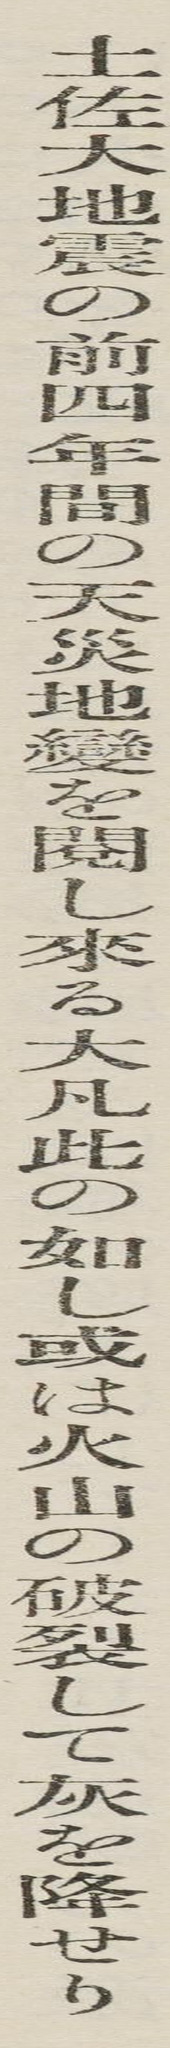土佐大地震の前四年間の天災地変を閲し来る大凡此の如し或は火山の破裂して灰を降らせり
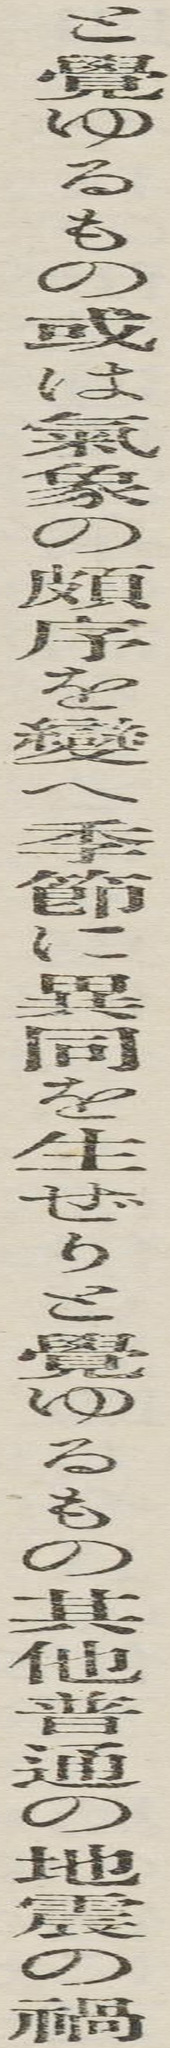と覚ゆるもの或は気象の頗序を変へ季節に異同を生ぜりと覚ゆるもの其他普通の地震の禍
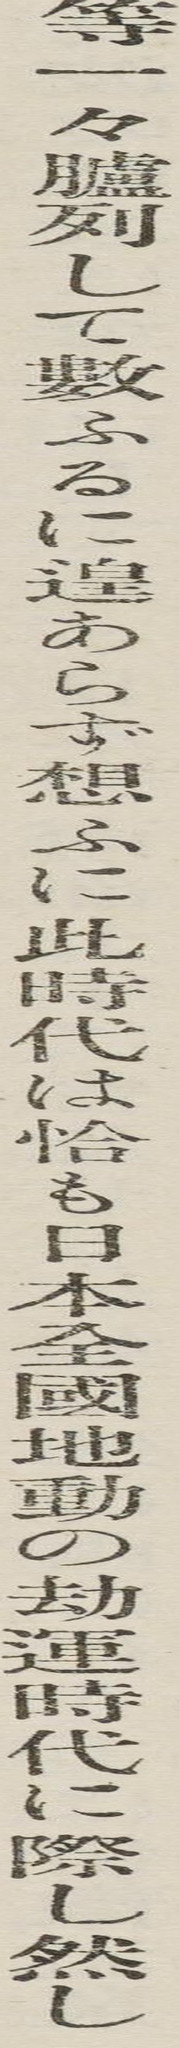等一々臚列して数ふるに遑あらず想ふに此時代は恰も日本全国地動の劫運時代に際し然し
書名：土佐古今ノ地震
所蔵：東京大学地震研究所図書室 Earthquake Research Institute Library, The University of Tokyo, JAPAN
